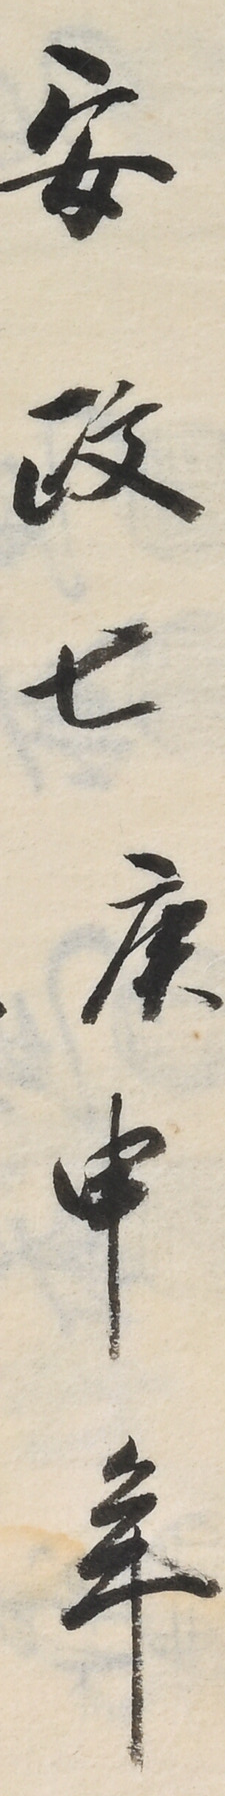安政七庚申年
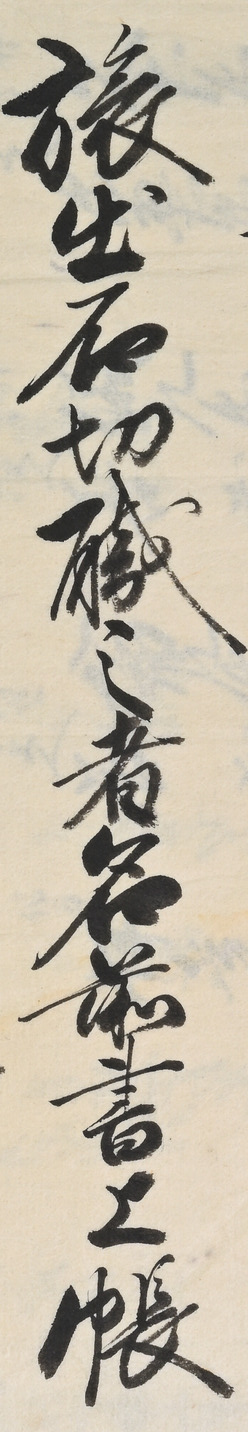旅出石切職之者名前書上帳
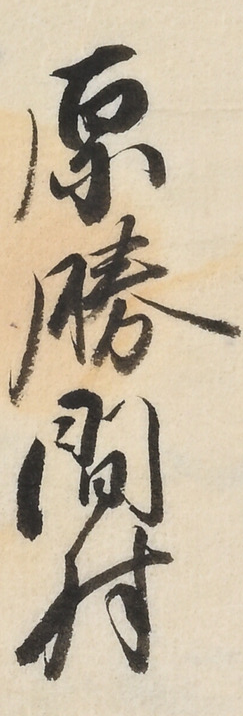原勝間村

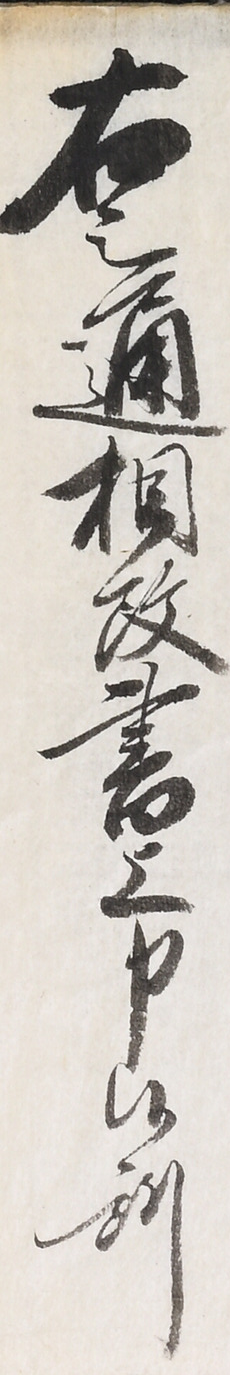右之通相改書上申候所
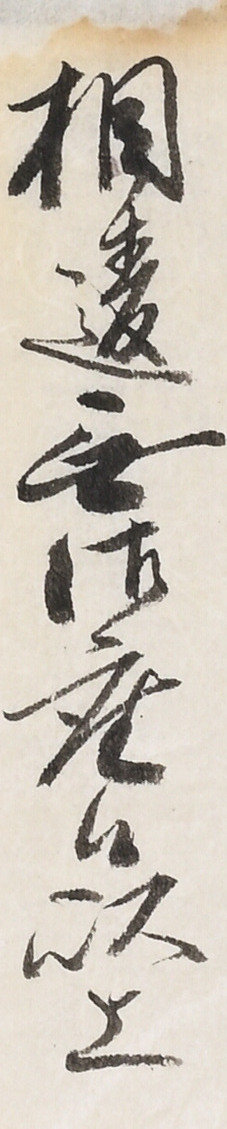相違無御座候以上
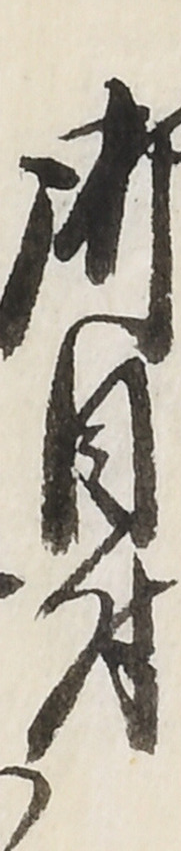御目付
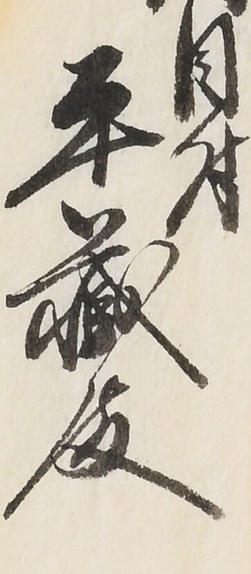平蔵殿
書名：安政七庚申年旅出石切職之者名前書上帳
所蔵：伊那市立高遠町図書館・合同会社AMANE
